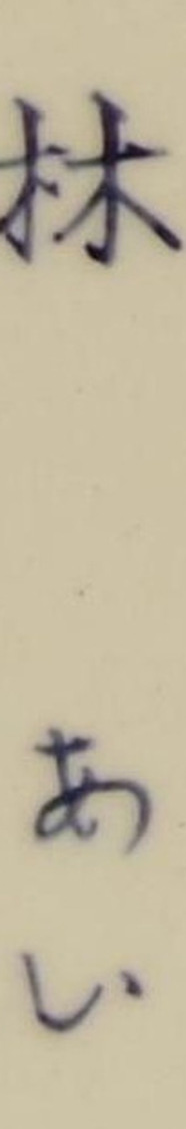林あい
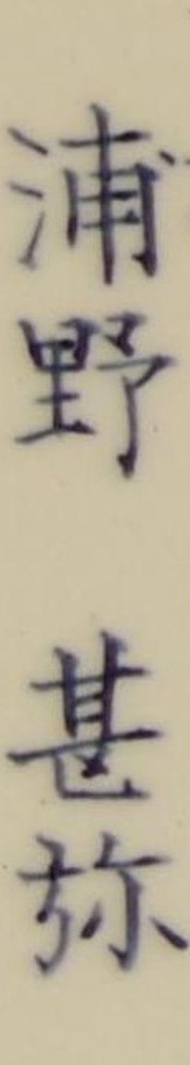浦野甚弥

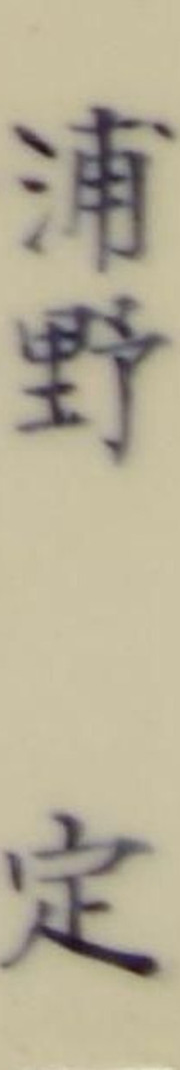浦野定
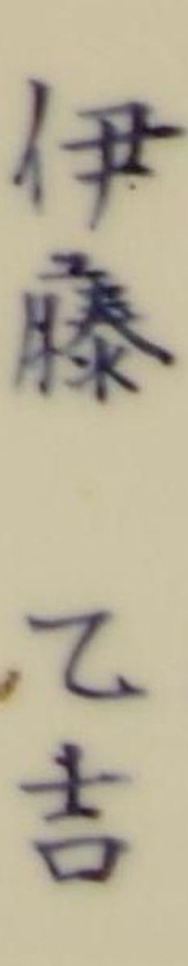伊藤乙吉
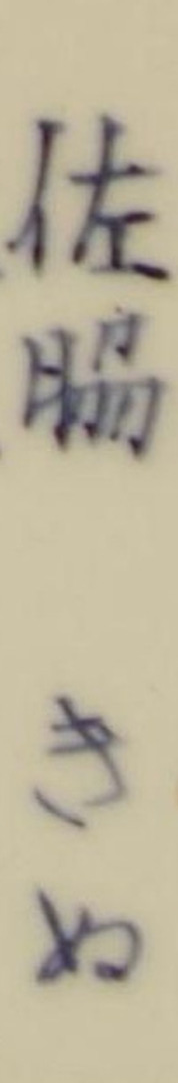佐脇きぬ
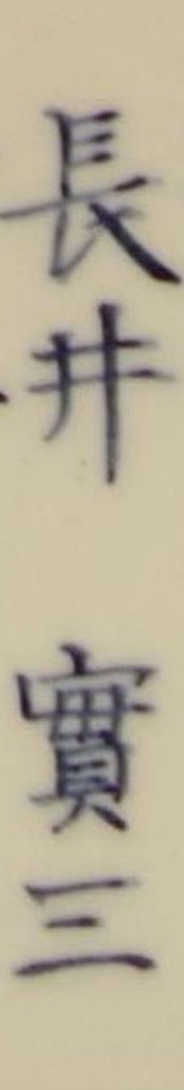長井実三
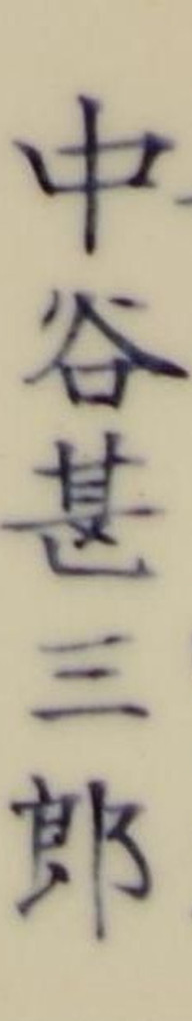中谷甚三郎
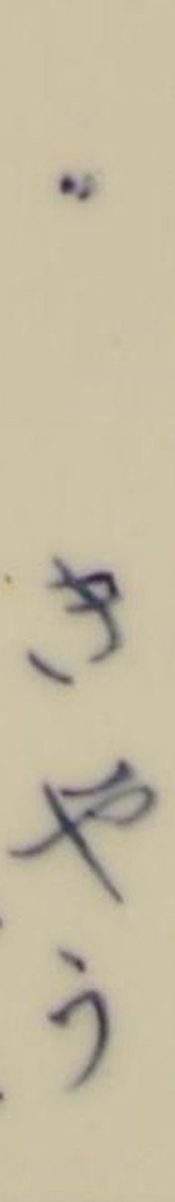きやう
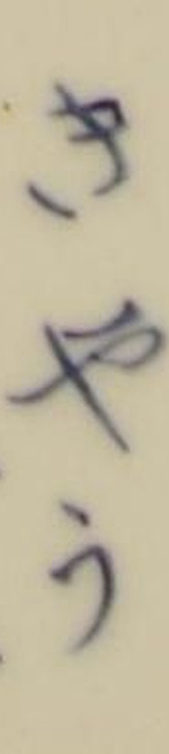きやう
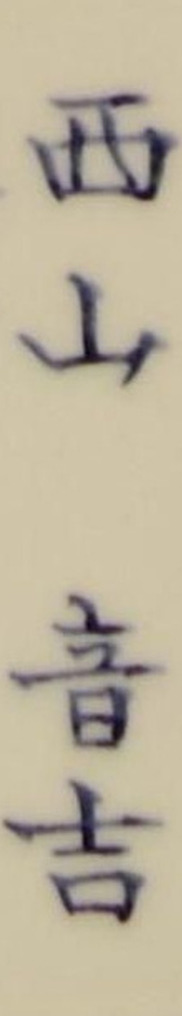西山音吉
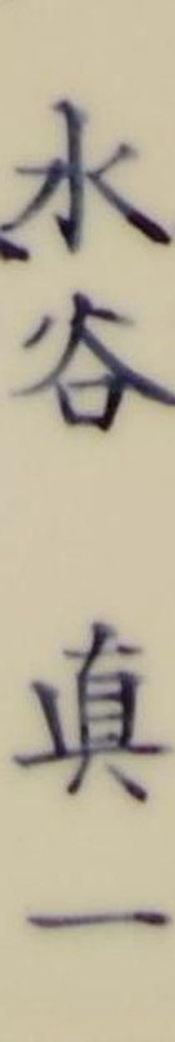水谷真一
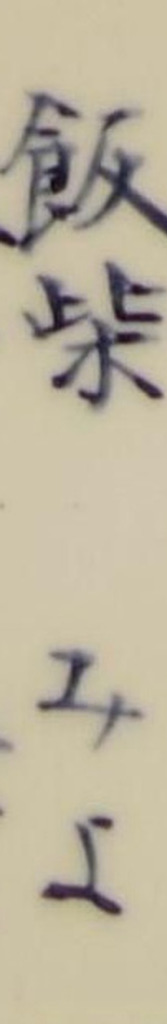飯紫みよ
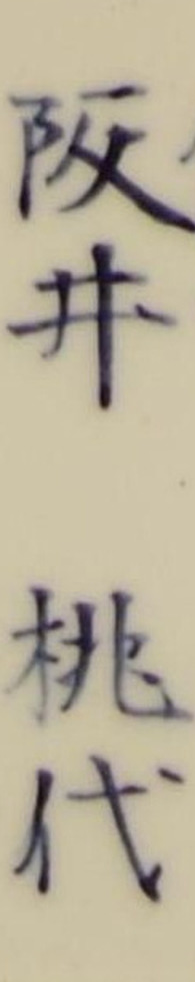阪井桃代
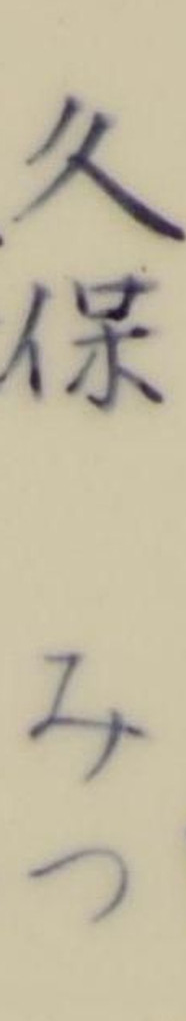久保みつ
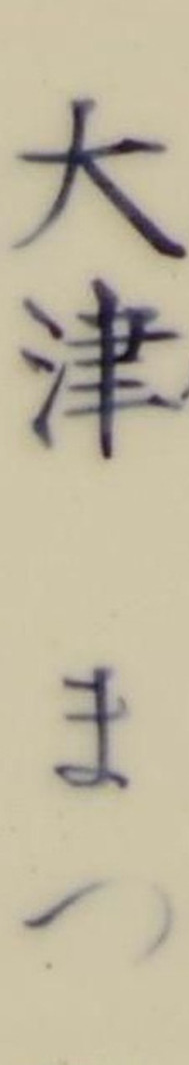大津まつ
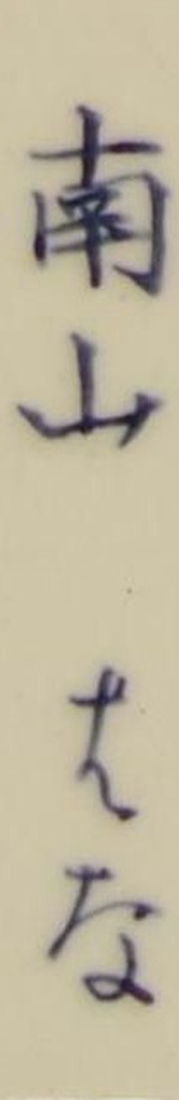南山はな
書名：E~L
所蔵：高野山金剛峯寺
